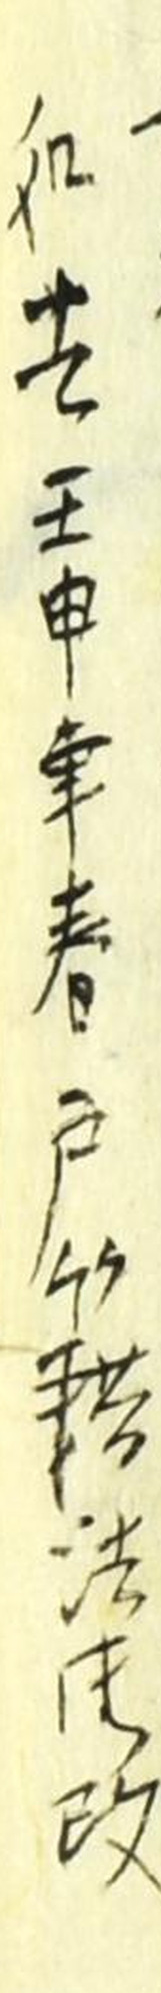処去壬申年春戸籍法御改

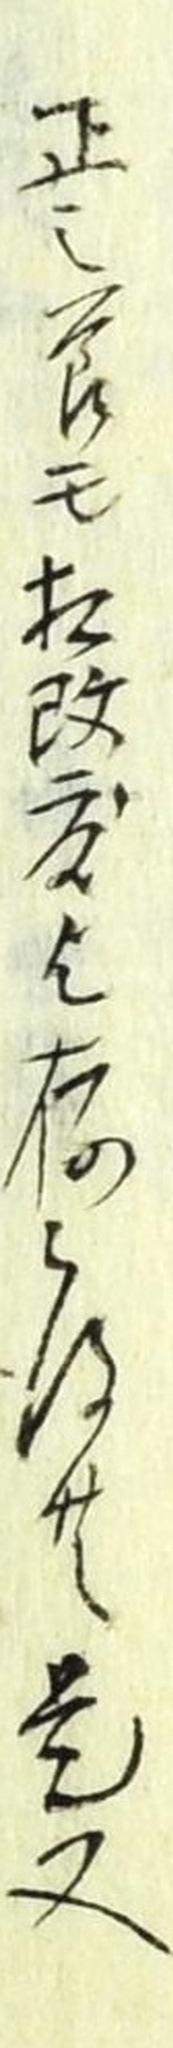正之節モ相改度与存候得共是又
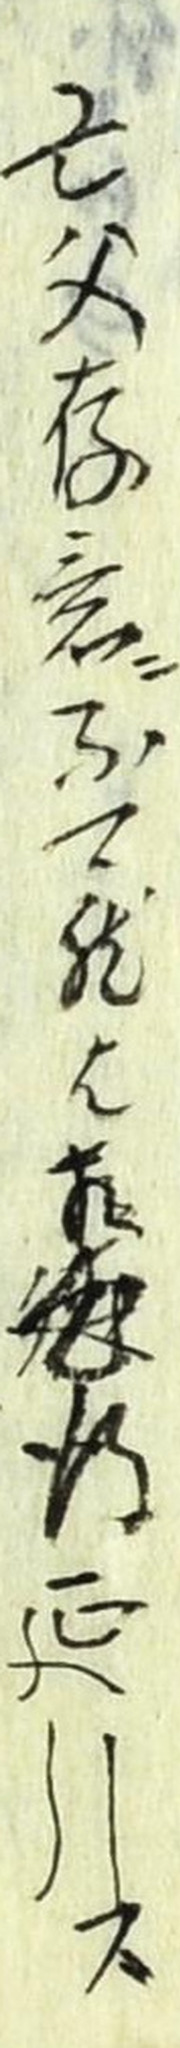亡父存意ニ不可然与相心得延引ス
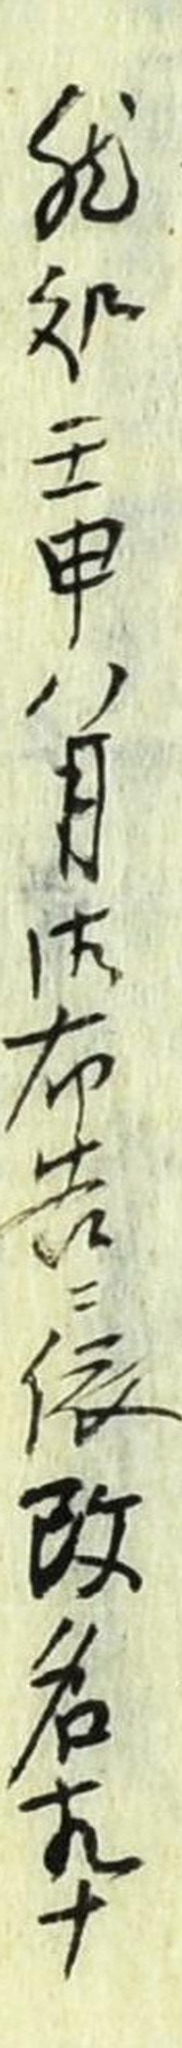然処壬申八月御布告ニ依改名相ナ
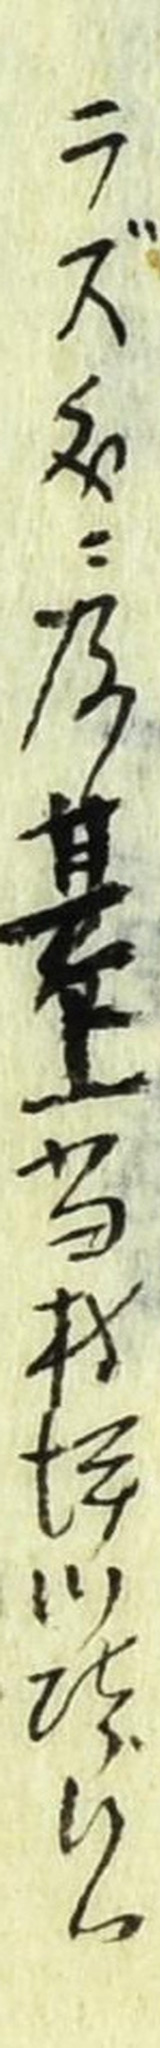ラズ義ニ及其上当村坪川次郎左衛門
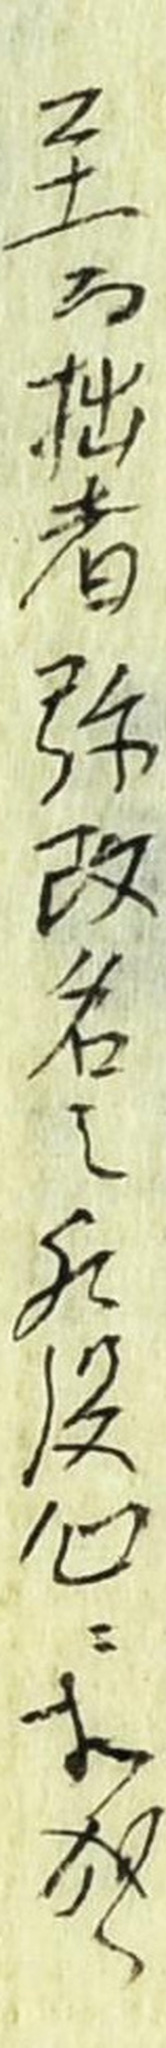至而拙者弥改名之発心ニ相成候
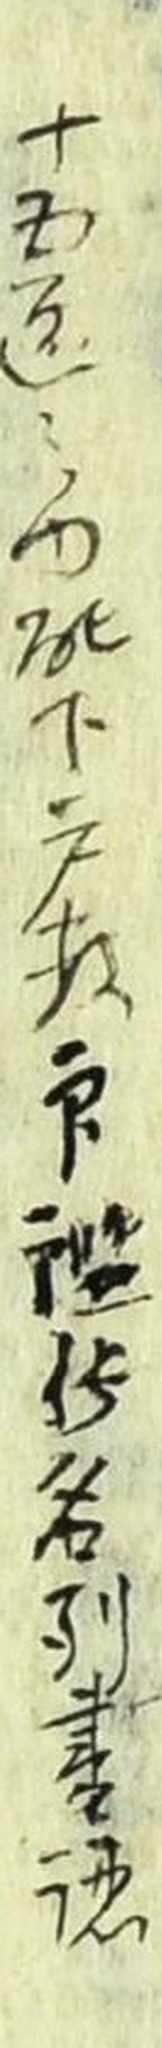十五区之内配下戸数印鑑帳名列書認
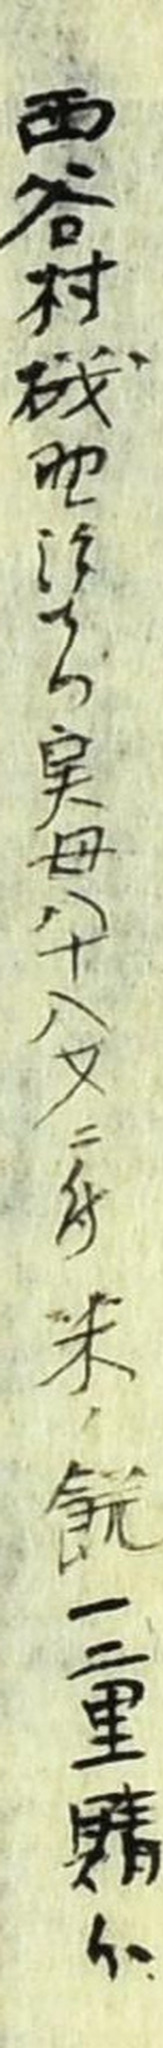西谷村磯野治右衛門実母八十八才ニ付米ノ餅一重賄候
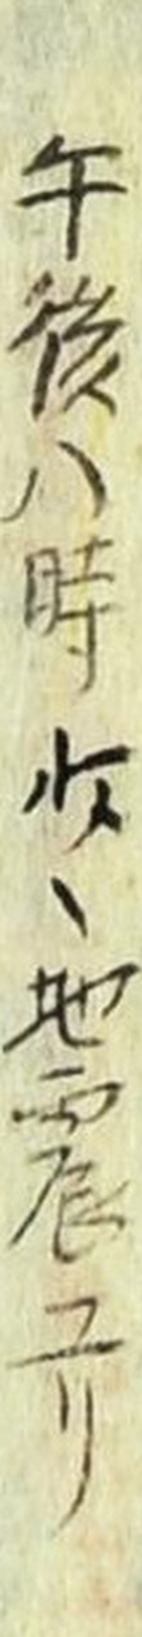午後八時少々地震ユリ
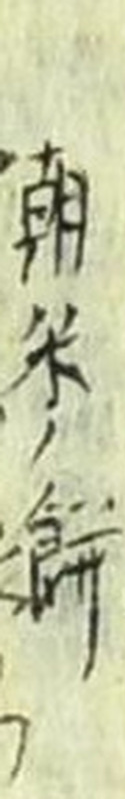朝米ノ餅
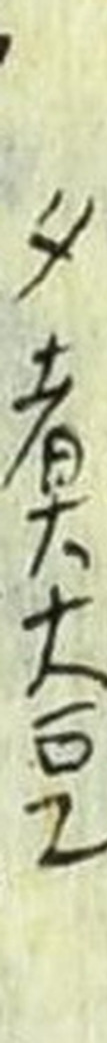夕煮大豆
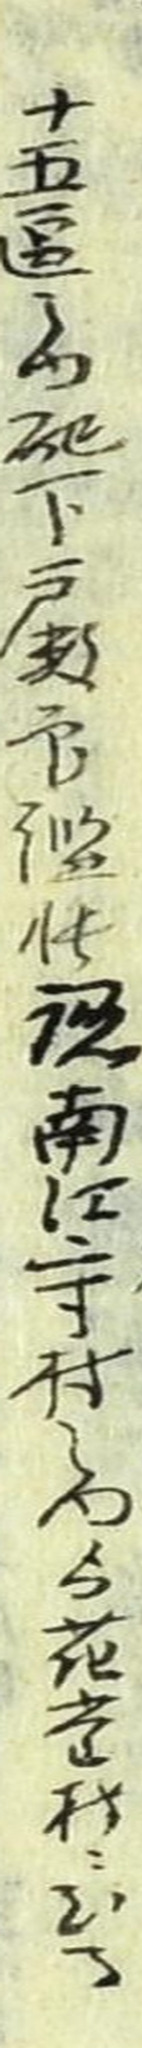十五区之内配下戸数印鑑帳認南江守村之内ゟ花堂村ニ至る
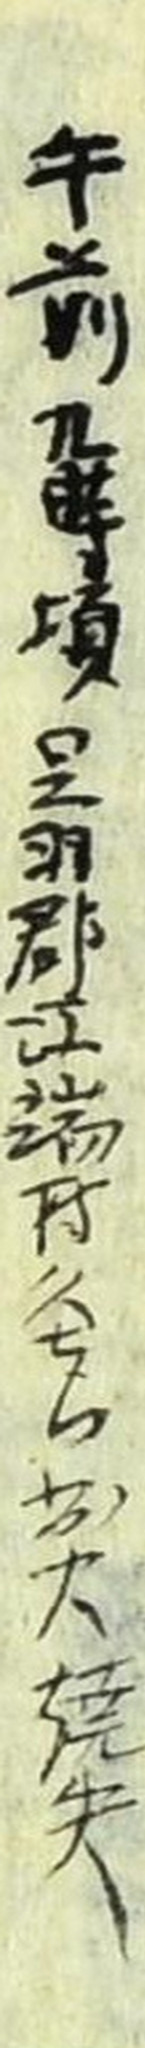午前九時頃足羽郡江端村久右衛門出火焼失
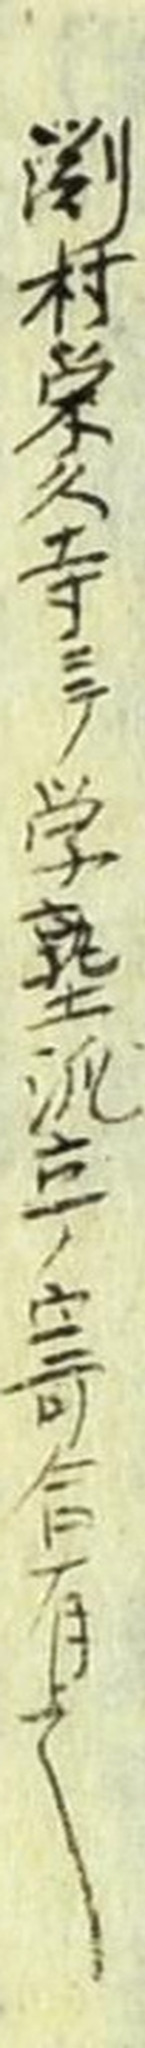淵村栄久寺ニテ学塾派立ノ寄合有之
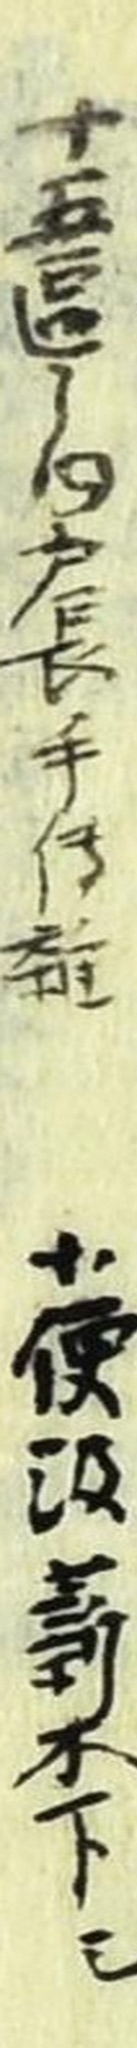十五区之内戸長手伝雑小便汲薪木下シ
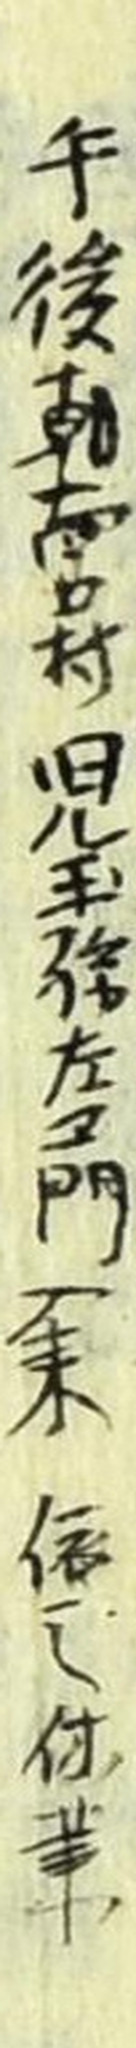午後朝宮村児玉孫左ヱ門入来依之休業
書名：（日記）
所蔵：福井県文書館 Fukui Prefectural Archives
